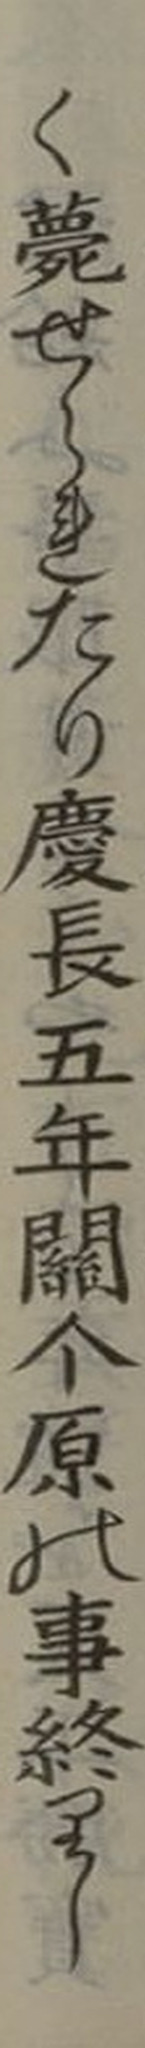く薨せられたり慶長五年關个原の事終りし
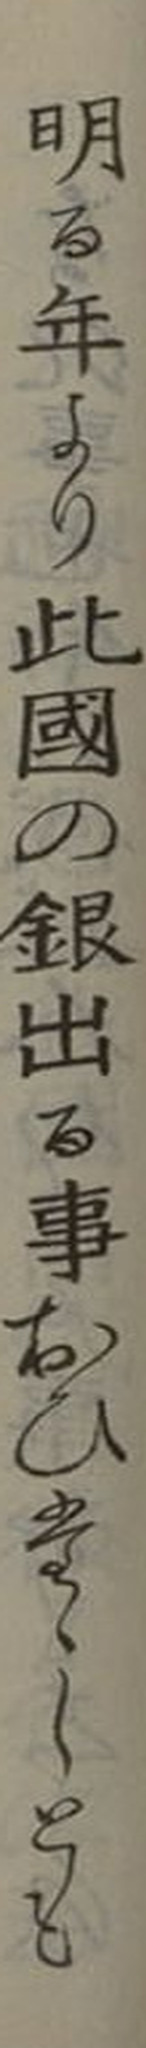明る年より此國の銀出る事おひたゝしとも
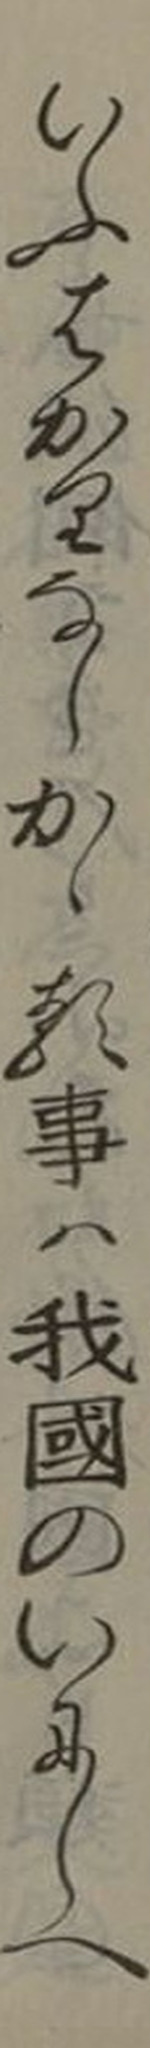いふはかりなしかゝる事は我國のいにしへ
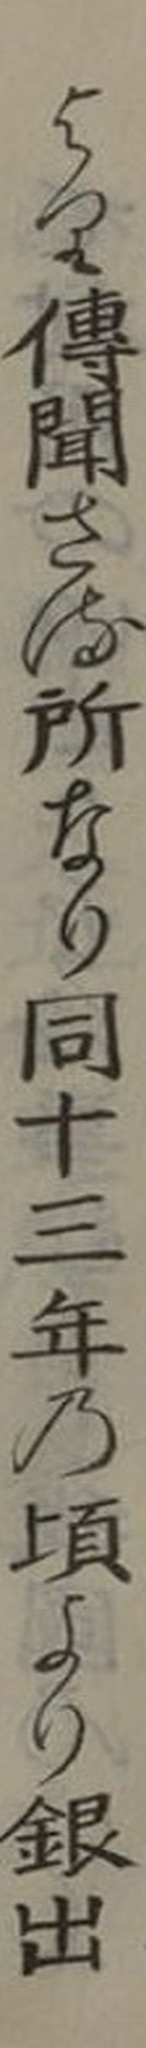より傳聞さる所なり同十三年の頃より銀出
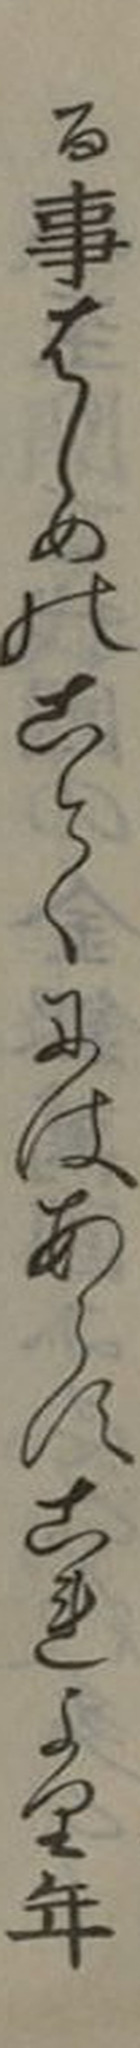る事はしめのことくにはあらすこれより年
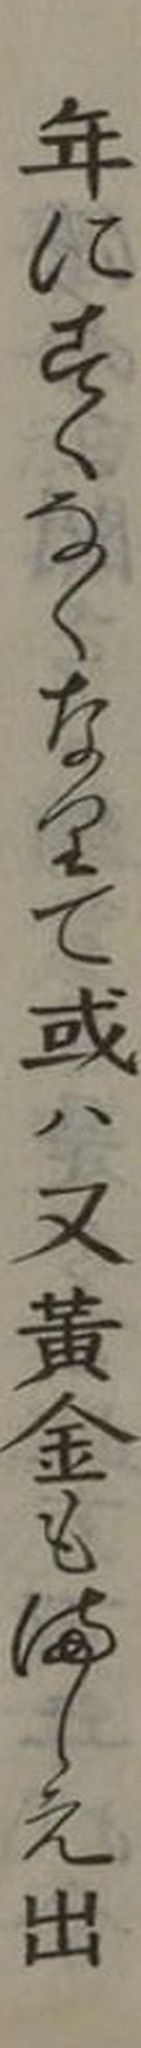年にすくなくなりて或は又黃金もましえ出
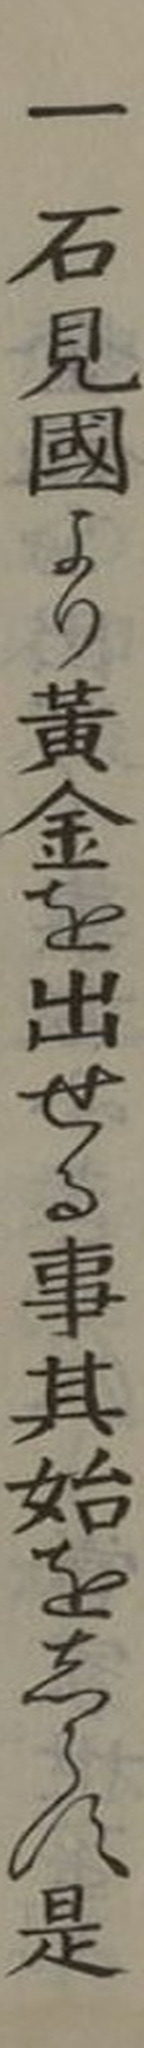一石見國より黃金を出せる事其始をしらす是
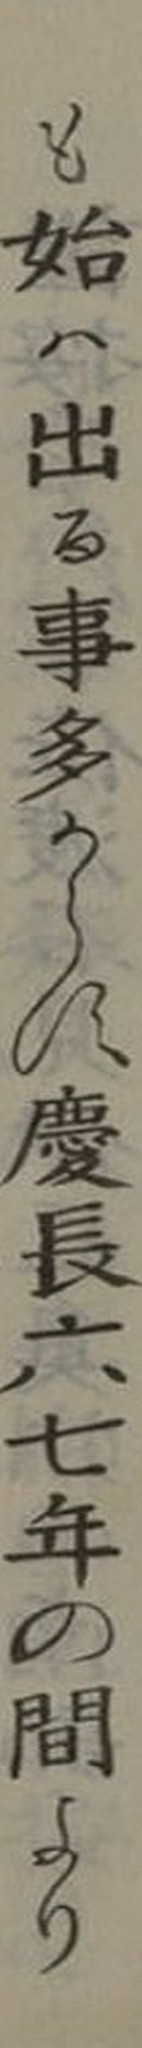も始は出る事多からす慶長六七年の間より
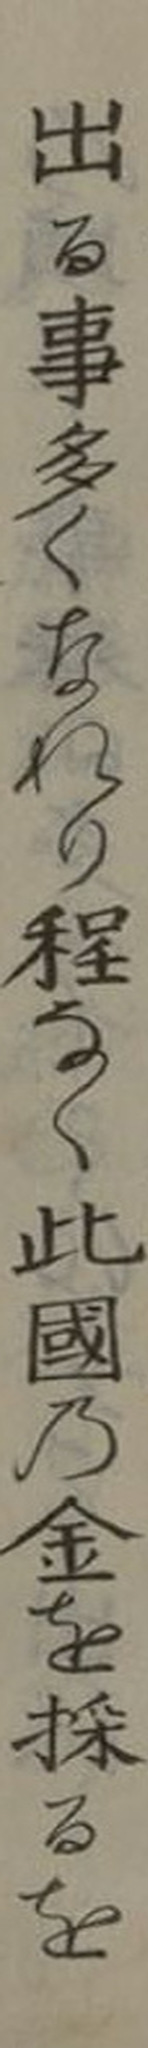出る事多くなれり程なく此國の金を採るを
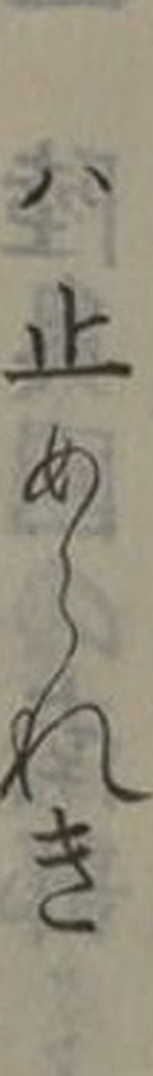は止められき
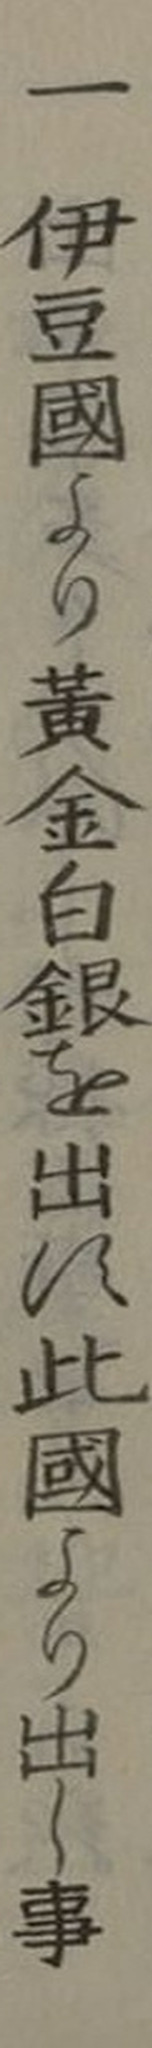一伊豆國より黃金白銀を出す此國より出し事
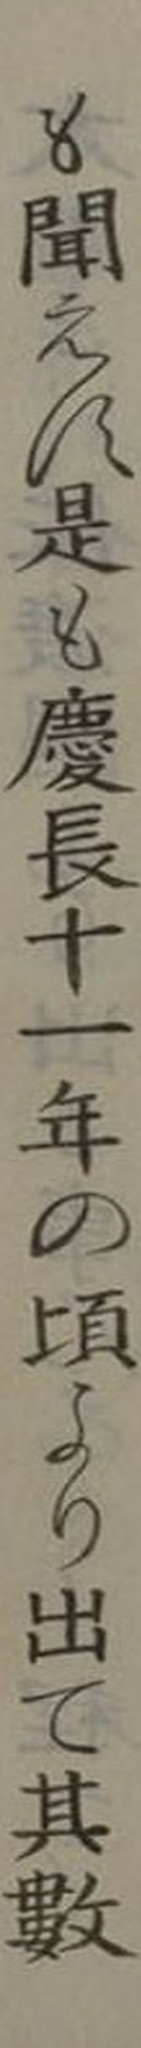も聞えす是も慶長十一年の頃より出て其數

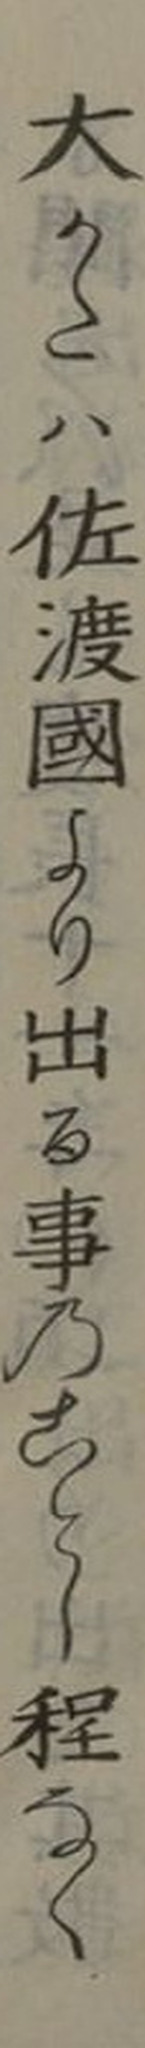大かたは佐渡國より出る事のことし程なく
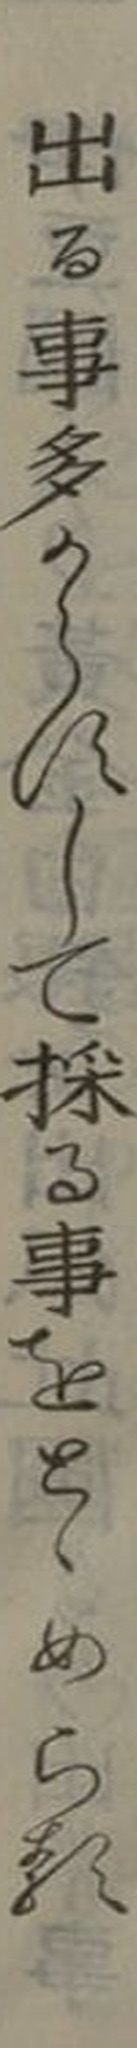出る事多からすして採る事をとゝめらる
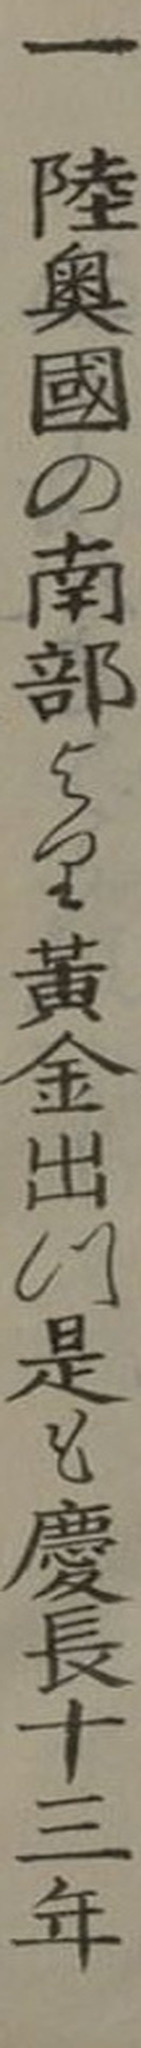一陸奥國の南部より黄金出つ是も慶長十三年
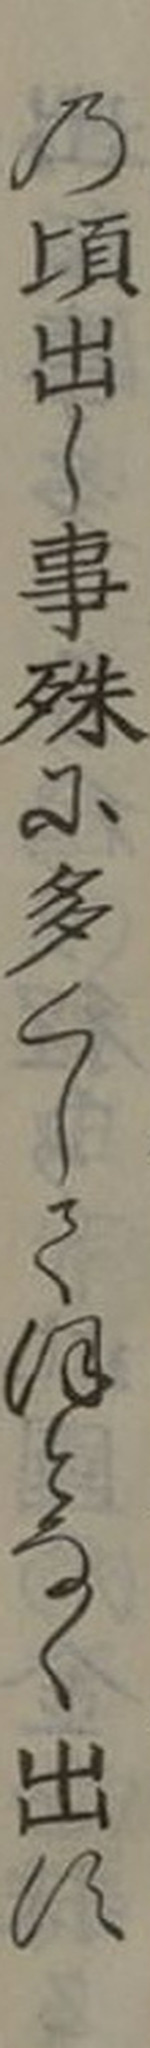の頃出し事殊に多くしてほとなく出す
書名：骨董録
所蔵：University of the Ryukyus Library
